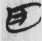耳
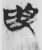受
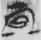○（期）
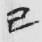己
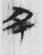丑
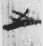之
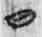日
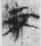不
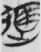𬨭（將）
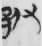○（付）
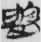○（舉）
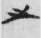之
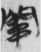○（關）
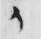人
